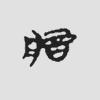{爿言}
